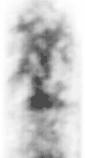○（魯）
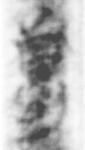○（陽）
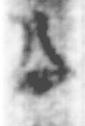公
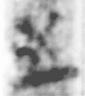之
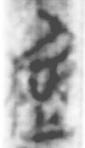○（路）
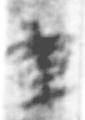車
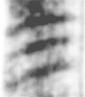三
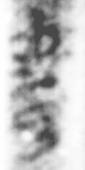𨍱（乘）
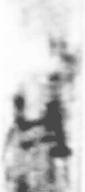凡
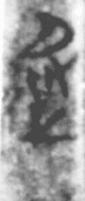○（路）
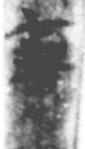車
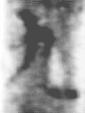九
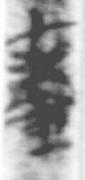𨍱（乘）
